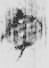宔（主）
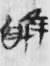顀
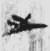之
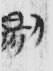傷
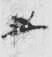之
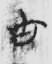古（故）
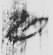㠯（以）
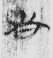告
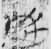阩
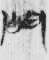門
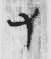又（有）
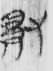敗
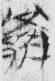○（羅）
